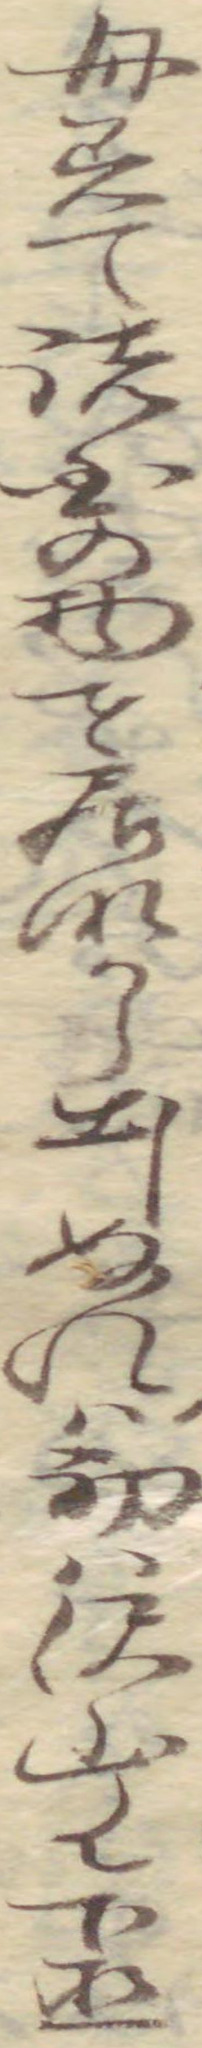舟着て諸国の物を居なから出しぬれは初は沢山ニて下直
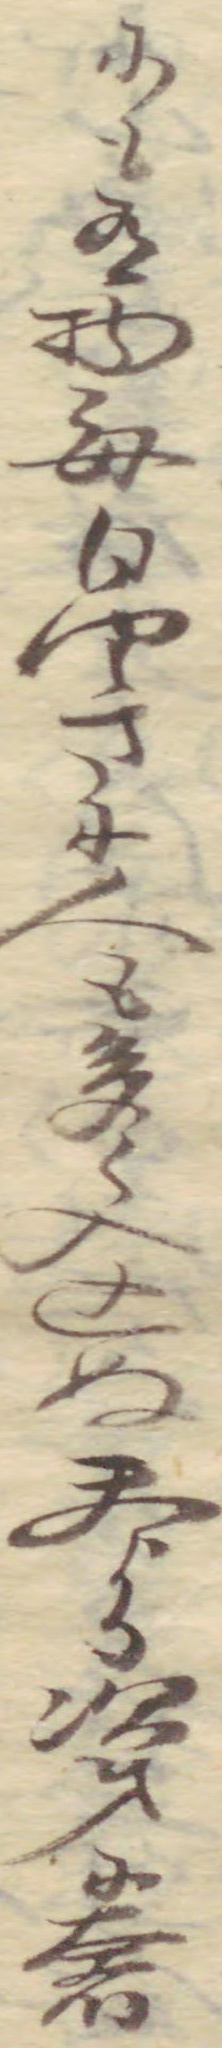にも有物毎自由さに人も多く入込ぬ夫より次第に奢
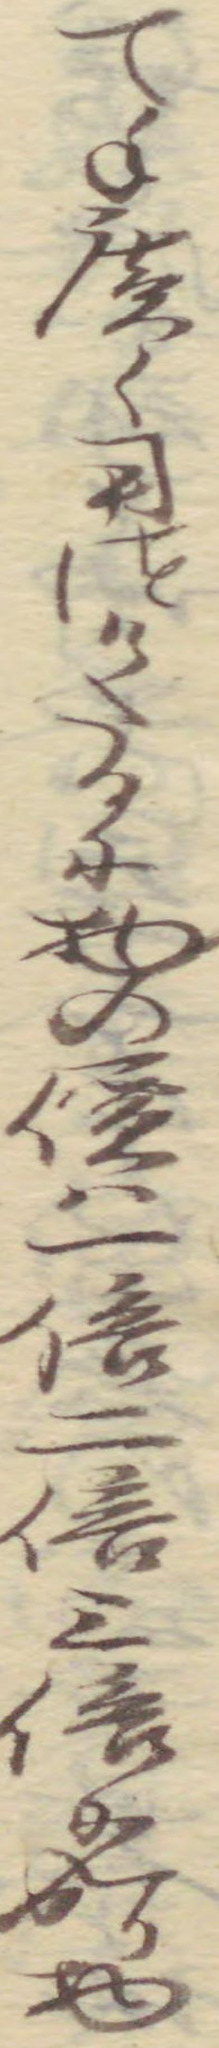て手広く用つけたるに物の優は一倍二倍三倍に成り物
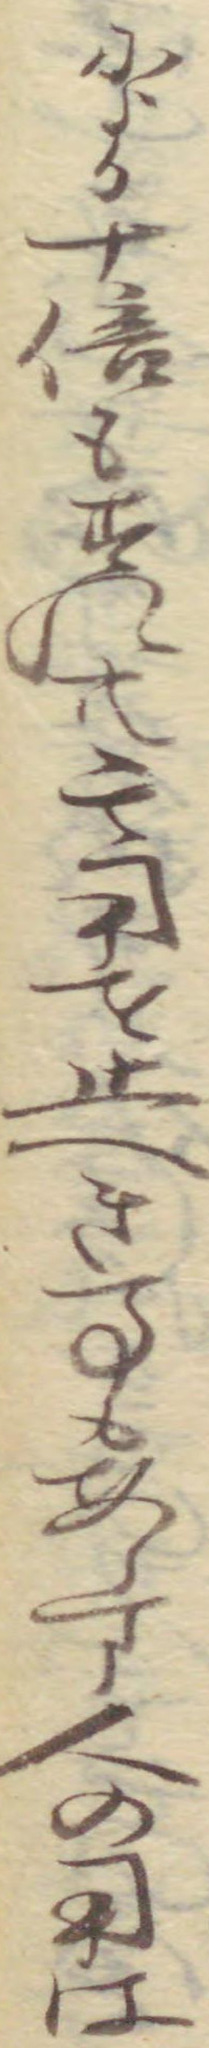により十倍もすれ共其用を止へき事もならす人の用は
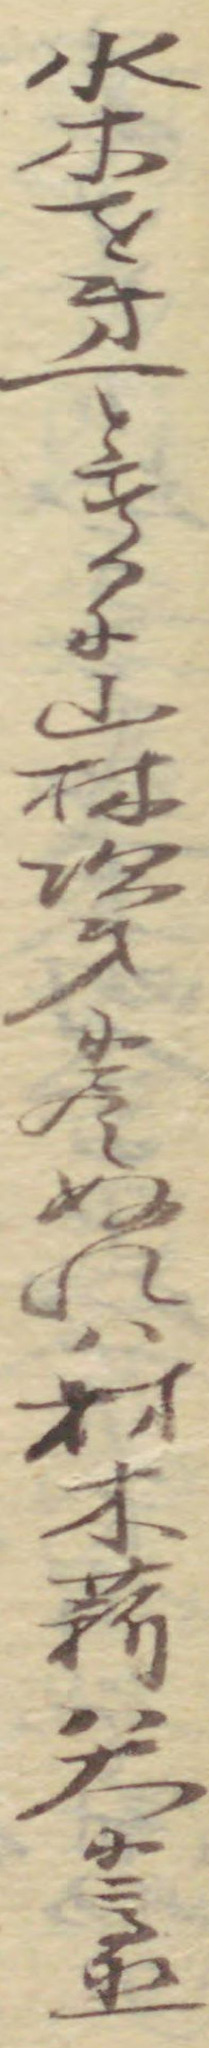水木を第一とするに山林次第に尽ぬれは材木薪は大に高直
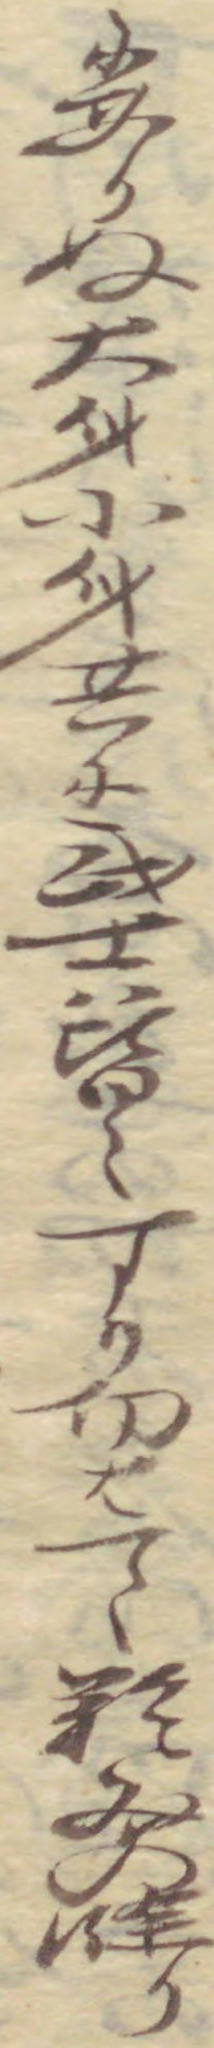になりぬ大身小身共に武士は皆〻すり切はてゝ難義の余り
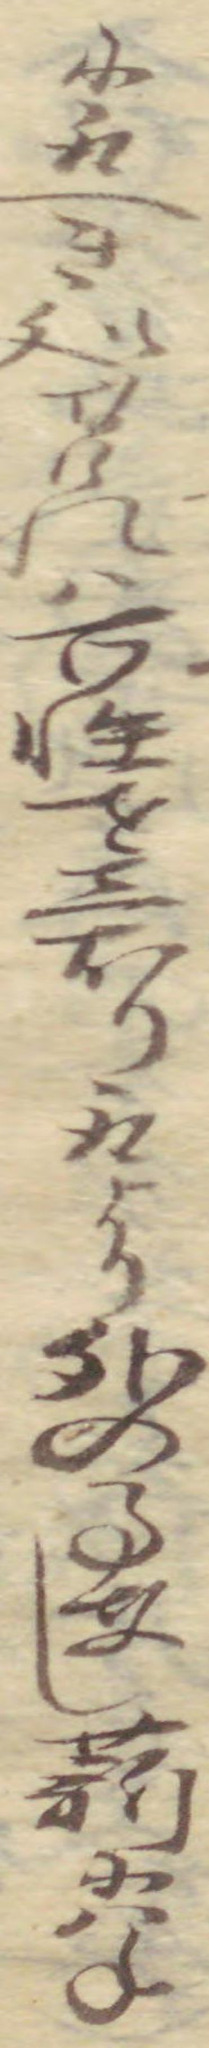に取へき処なけれは百姓をしほり取より外の事なし薪には手
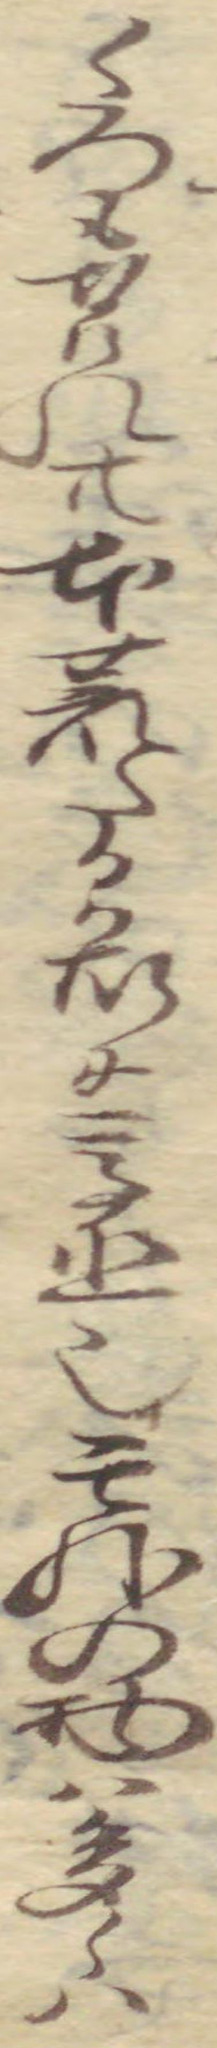くろもなけれ共本荒たるか故に高直也其外の物は多くは
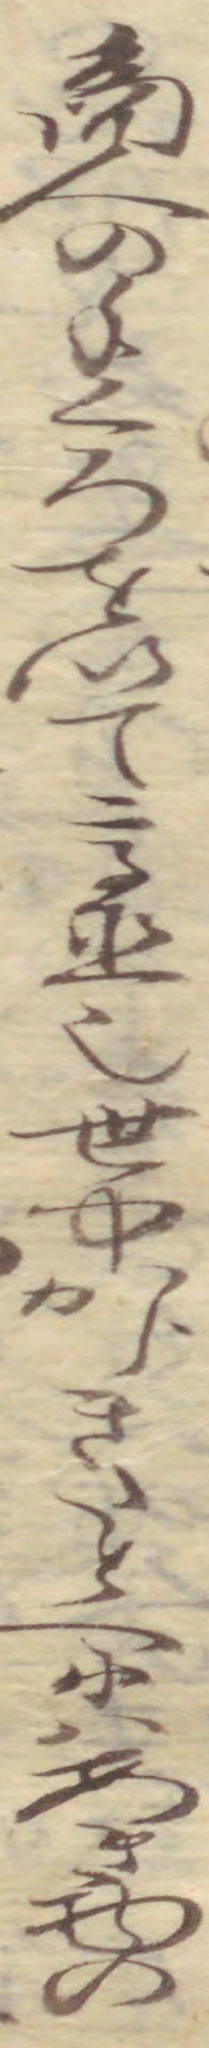商人の手くろを以て高直也世中からきたとへにはあき物の
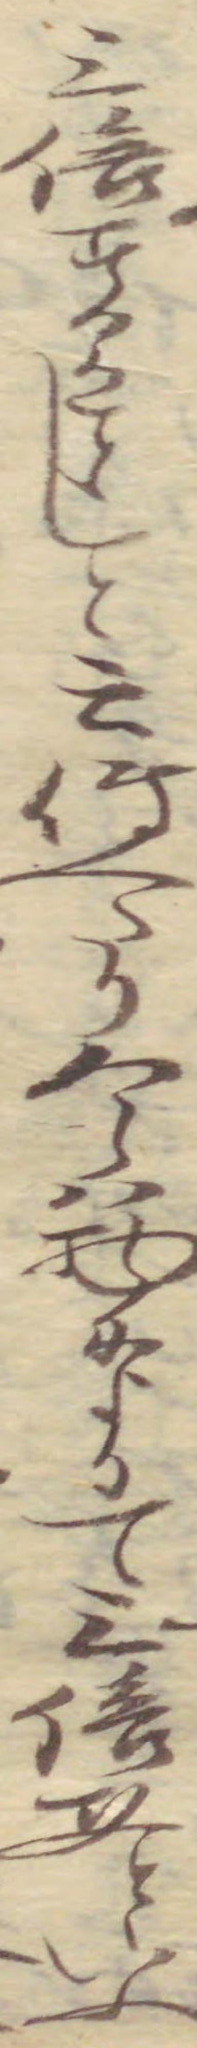三倍するかことしと云伝へたり今は物によりて三倍なといふ
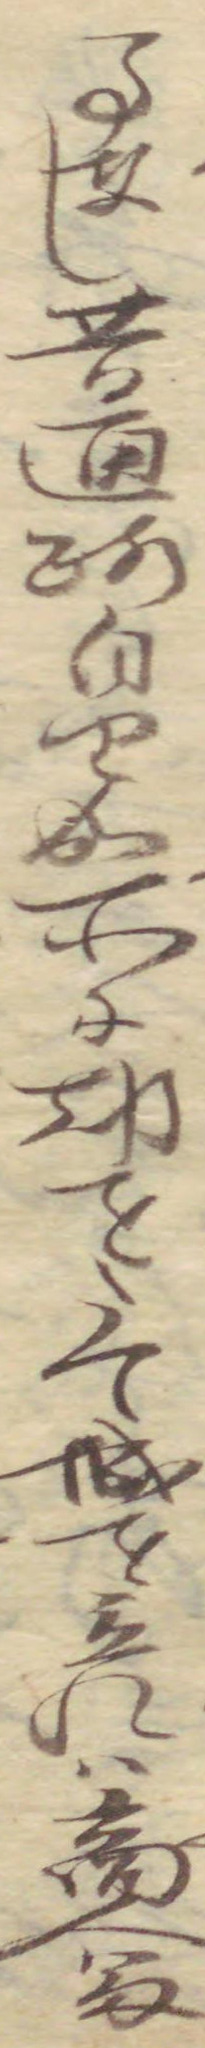事なし昔通路自由成所に都をたて城を立れは商人富
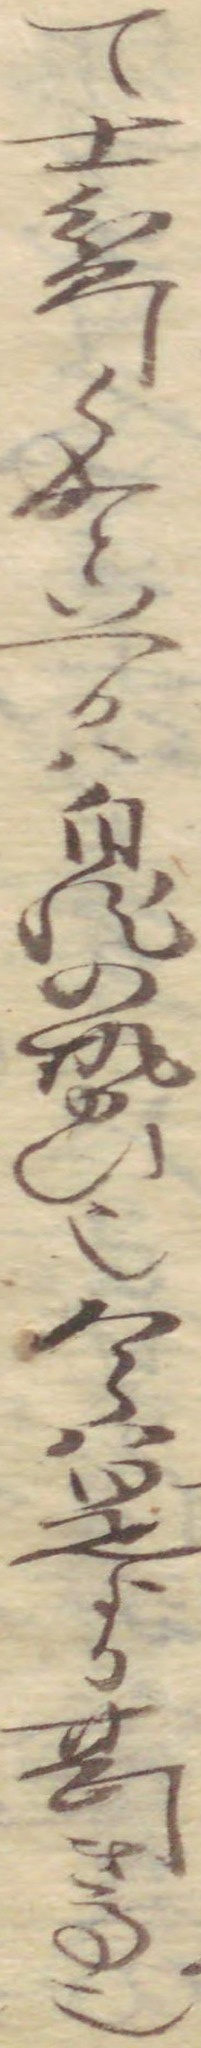て士貧しく成といへるは自然の勢ひ也今は是より甚しき事也
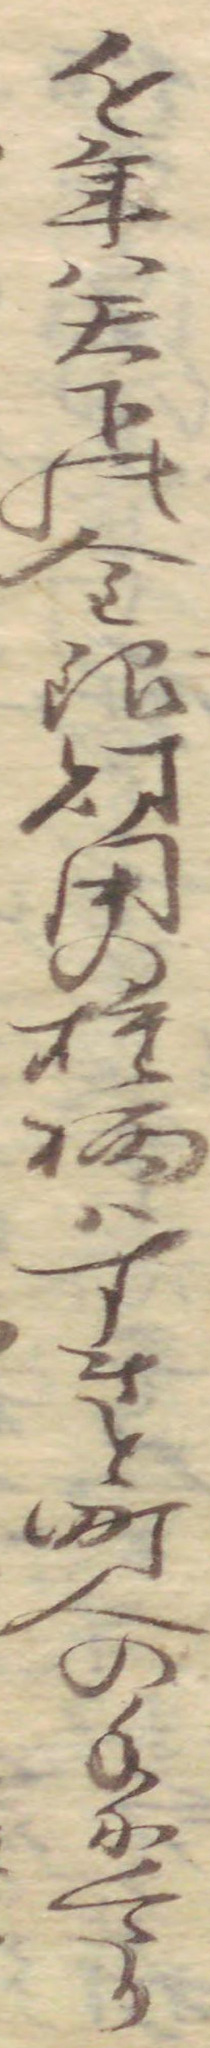近年は天下の金銀財用の権柄はすきと町人の手にくたり
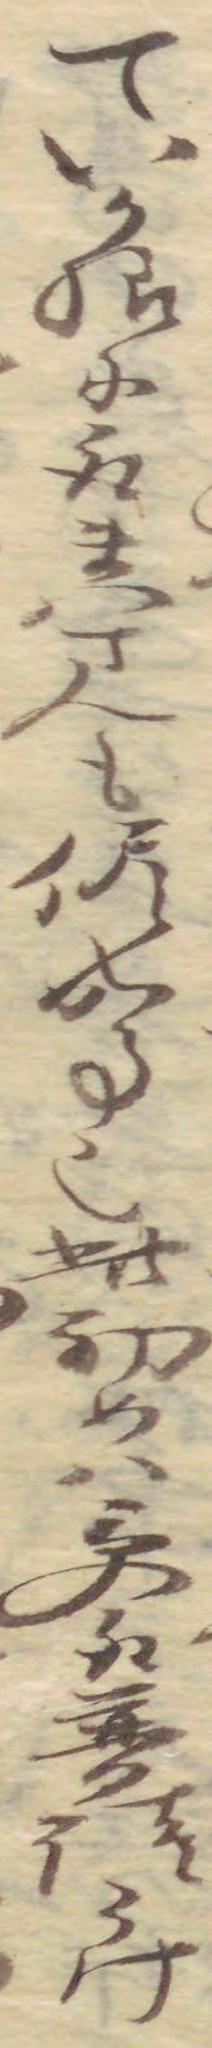ていか様に取まはさんも侭成事也此初めは受取普請うけ
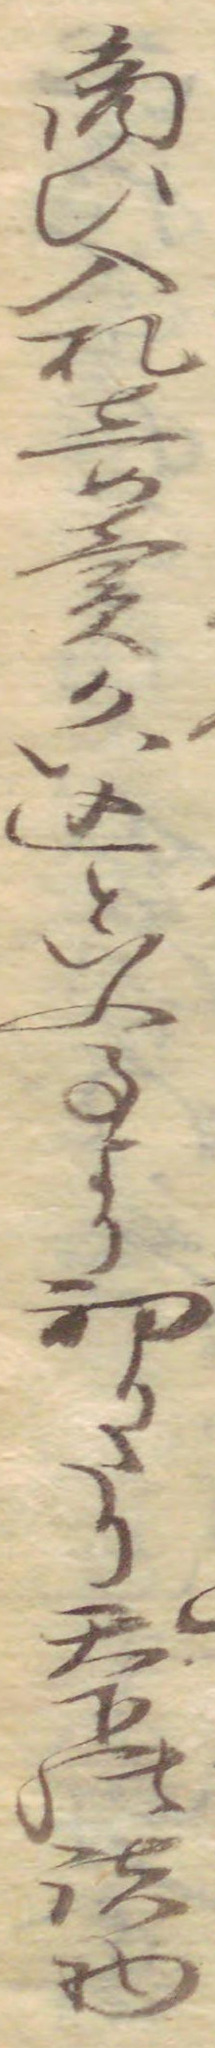商ひ入札しめ売かい込といふ事より初りたり天下の諸物

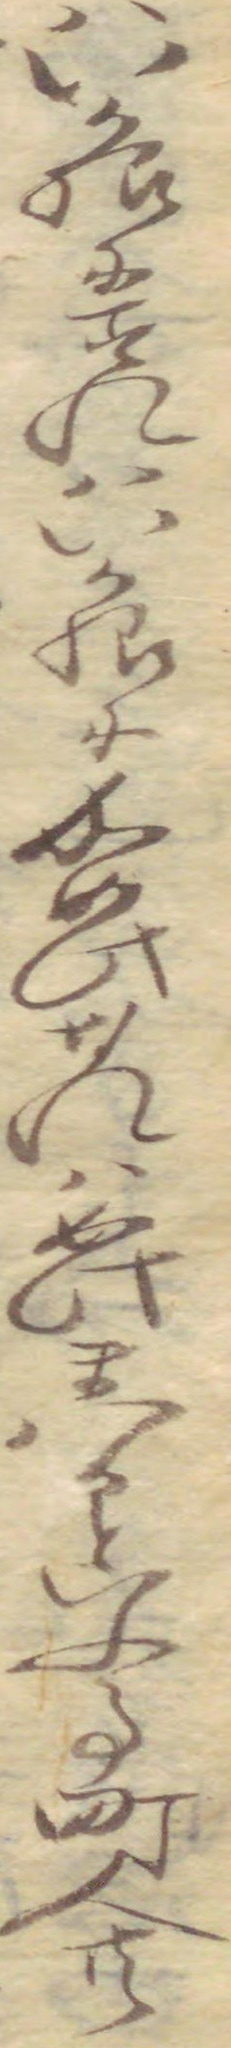はいか様にすれはいか様に成如此なれは如此まはるといふ事町人共
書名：鶯宿雑記. 巻263-264
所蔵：国立国会図書館 National Diet Library, JAPAN
